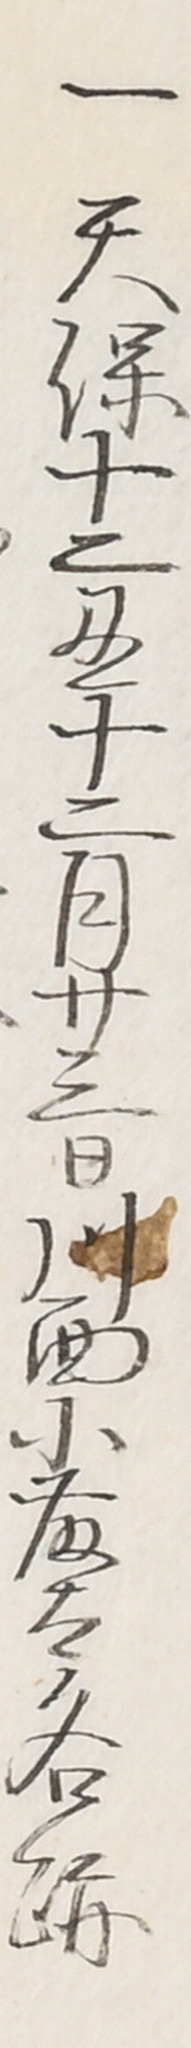一天保十二丑十二月廿三日川西小藤太名跡
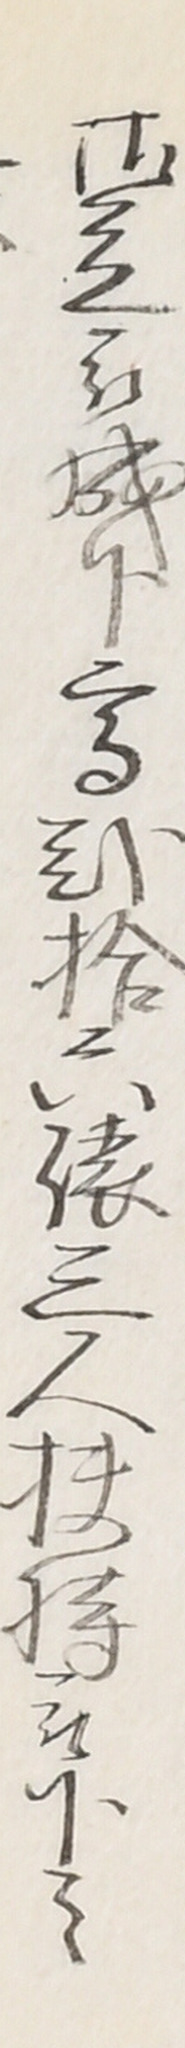御立被成下高弐拾六俵三人扶持被下之
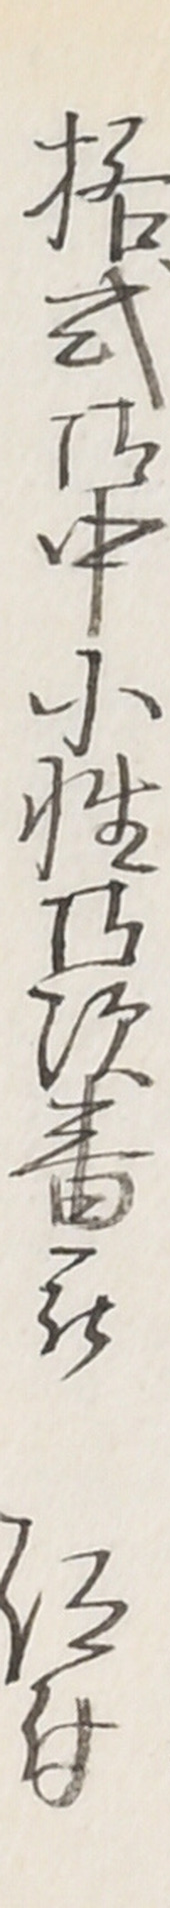格式御中小性御次番被仰付

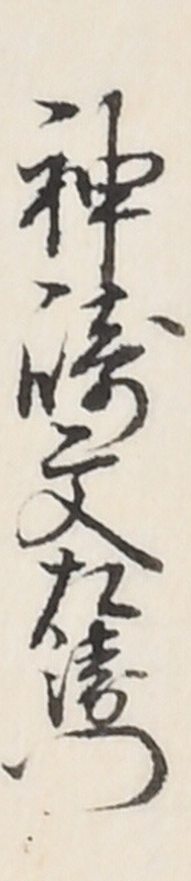神崎文左衛門
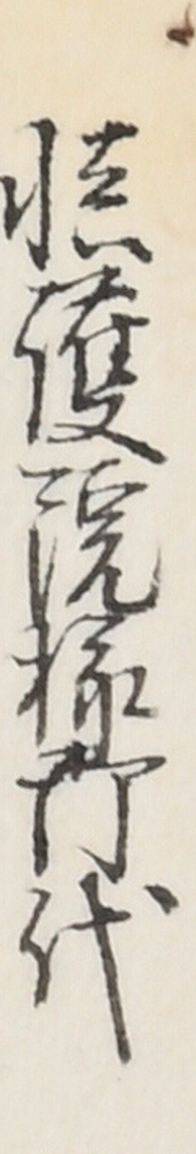慎護院様御代
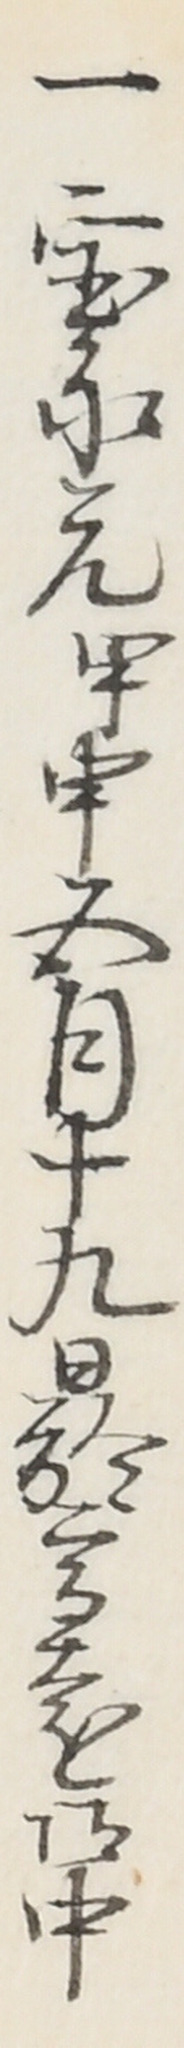一宝永元甲申五月十九日於高遠御中
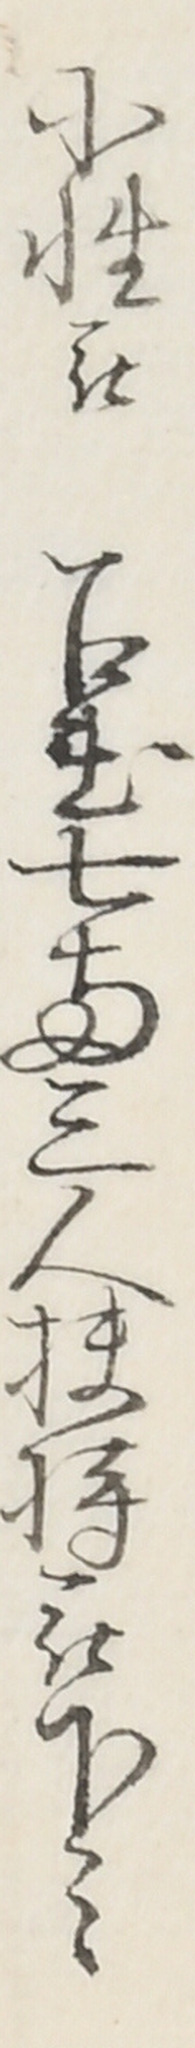小性被召出七両三人扶持被下之
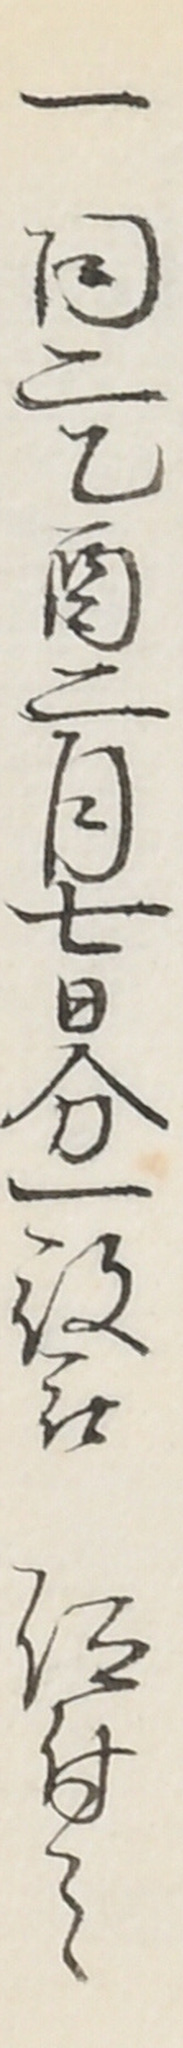一同二乙酉二月七日分一役被仰付之
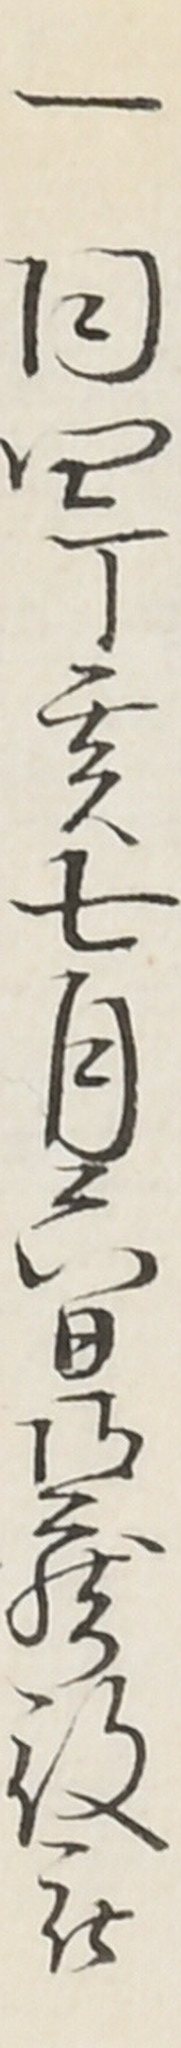一同四丁亥七月六日御蔵役被
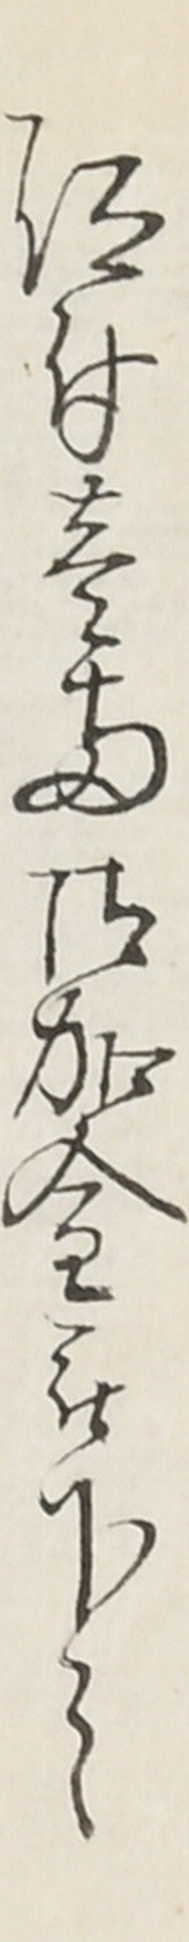仰付壱両御加金被下之
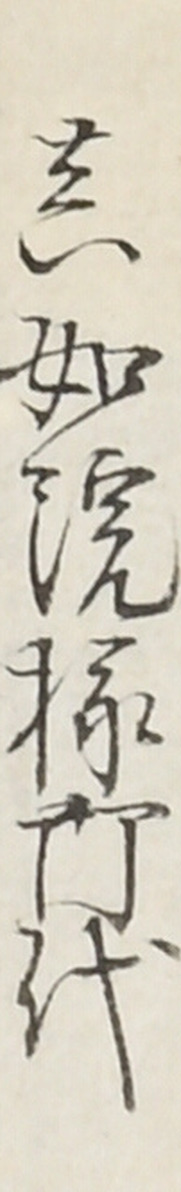真如院様御代
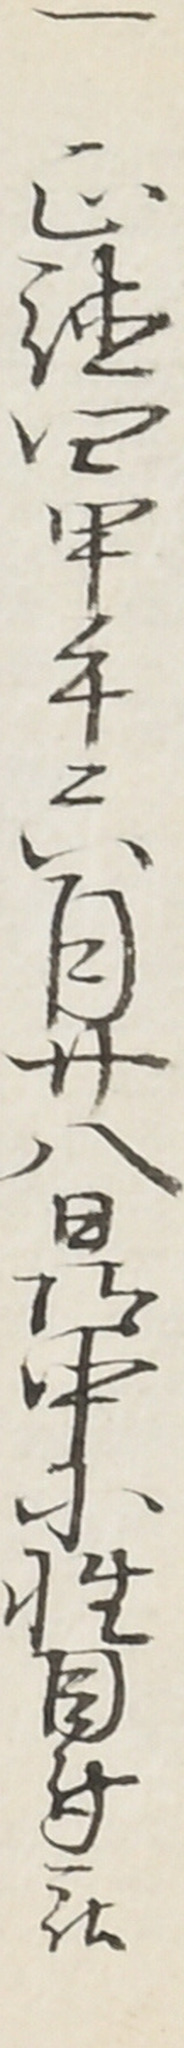一正徳四甲午六月廿八日御中小性目付被
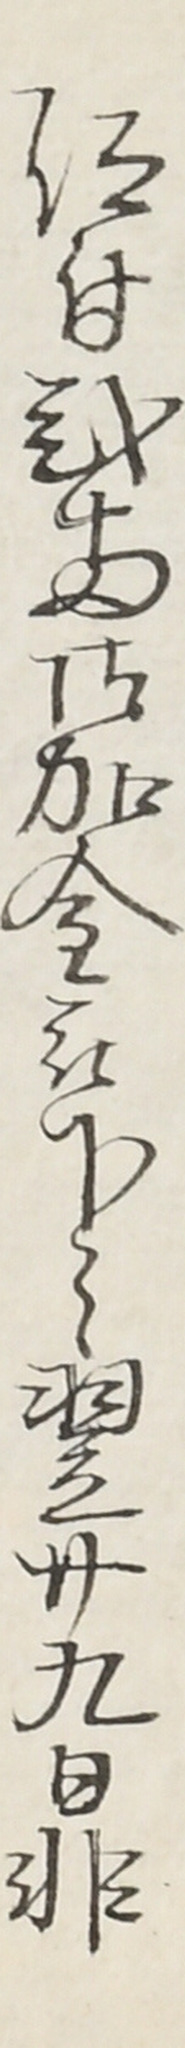仰付弐両御加金被下之翌廿九日非
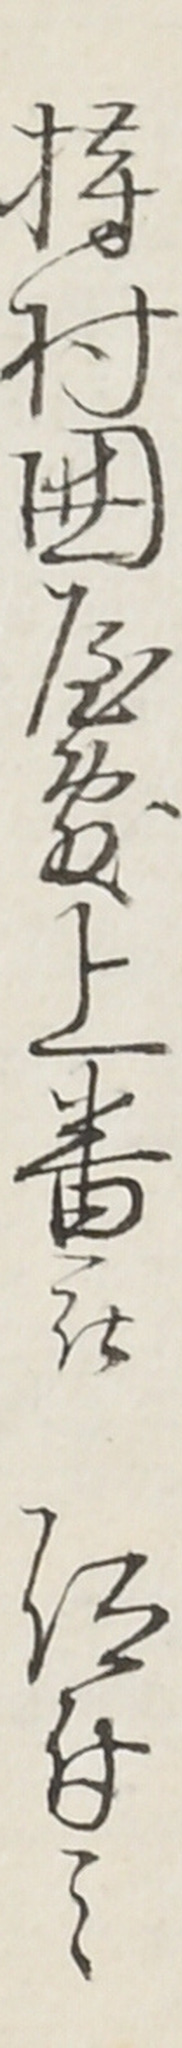持村囲屋敷上番被仰付之
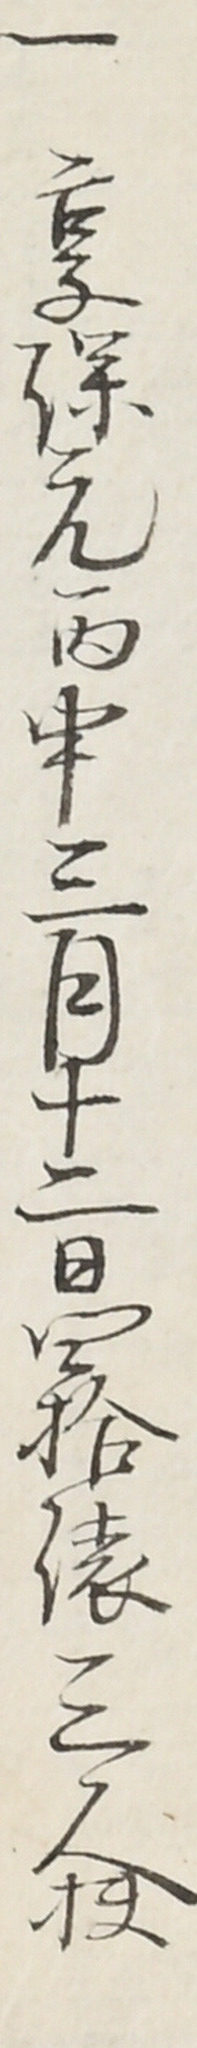一享保元丙申三月十二日四拾俵三人扶
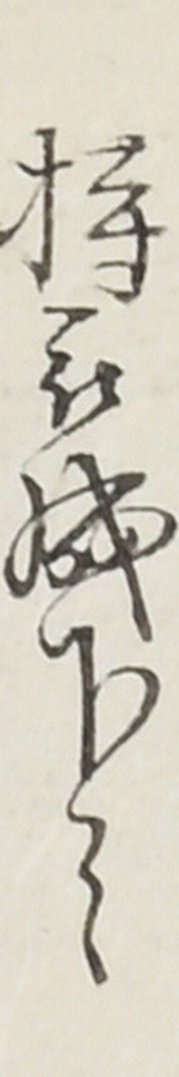持被成下之
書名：給人諸士勤仕録（七）
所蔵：伊那市立高遠町図書館・合同会社AMANE
